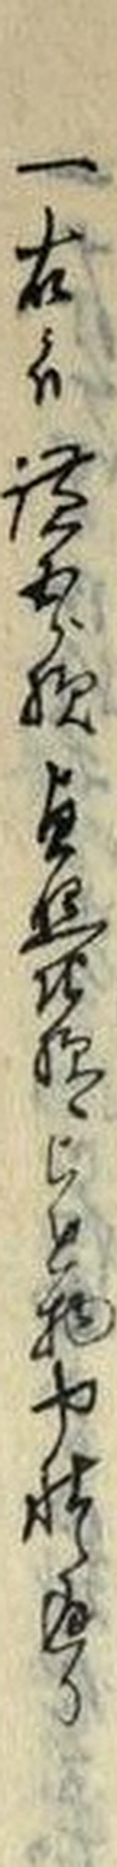一右ニ付謙五郎様貞照院様へ被進物中秋之通り

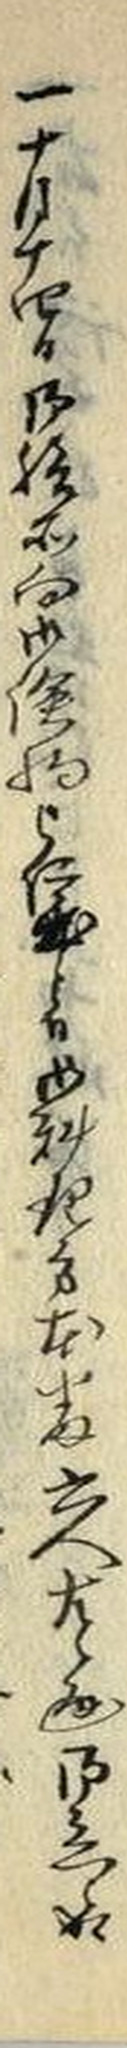一十月十四日御膳所向御倹約被仰出候ニ付御料理方本番六人左之通御立被成候
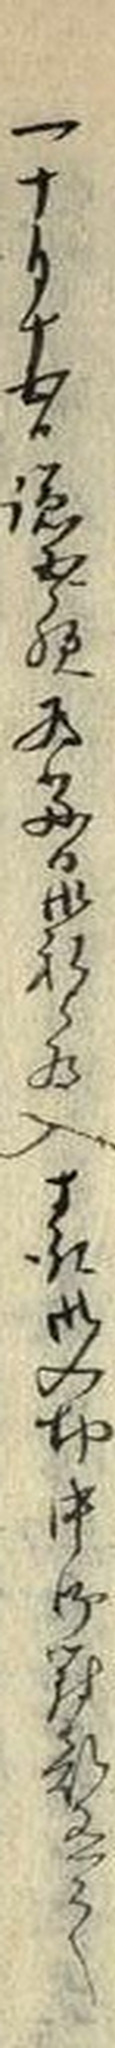一十月十五日謙五郎様為当日御礼被為入表御〆切中御対顔有之
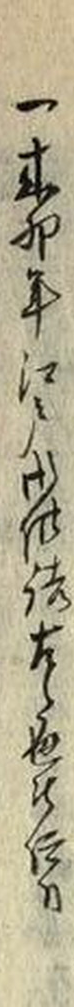一来卯年江戸御供詰左之通被仰付
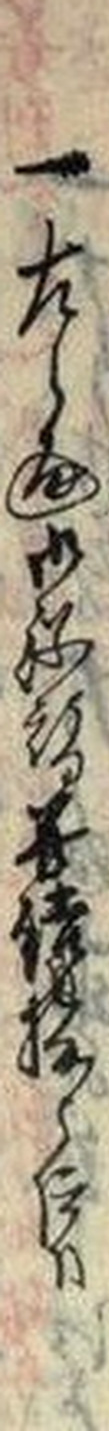一左之通御役替幷結構被仰付
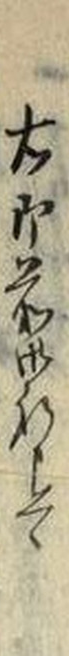右御前御礼申上候
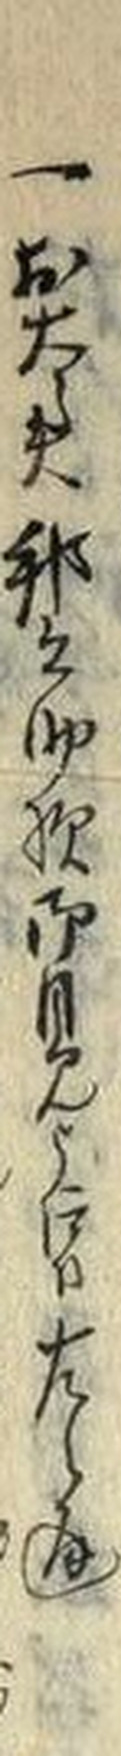一於大奥邦之助様御目見被仰付左之通
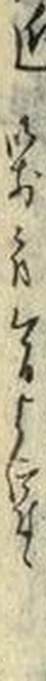以前ニ付今日被仰付候

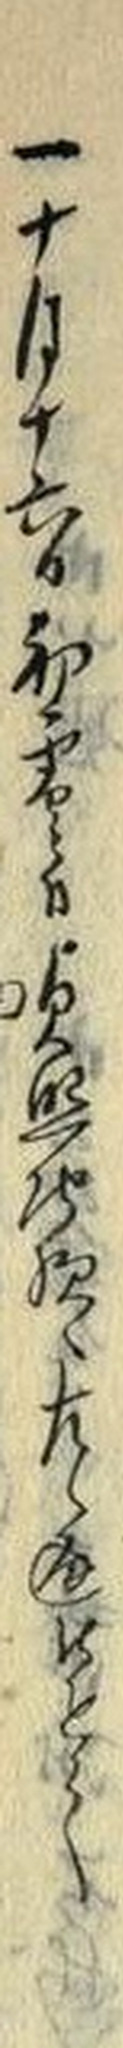一十月十六日初雪ニ付貞照院様へ左之通被進之
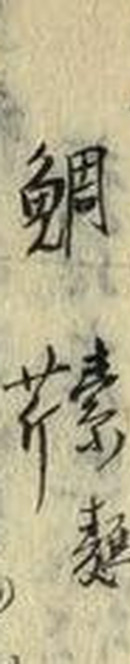鯛素麵
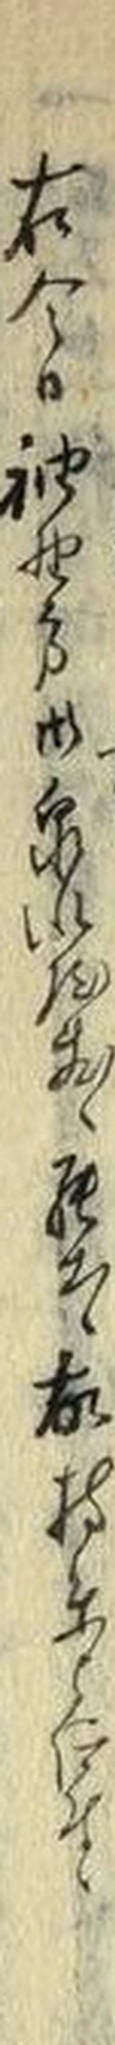右今日袖野方御泉水屋敷へ罷出候故持参被仰付候
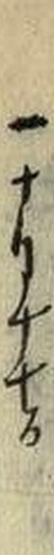一十月十七日
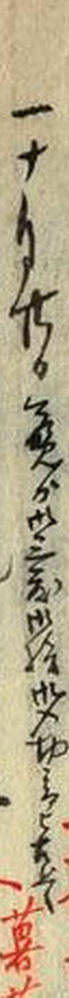一十月廿日今晩ゟ御三度御膳御〆切ニ而被召上候
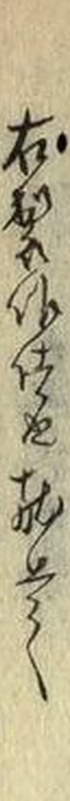右製作仕候由献上之
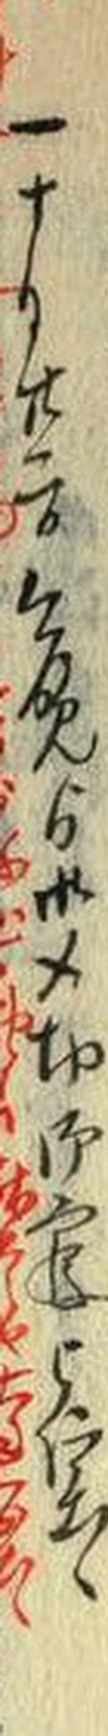一十月廿二日今晩ゟ御〆切御寝被仰出候
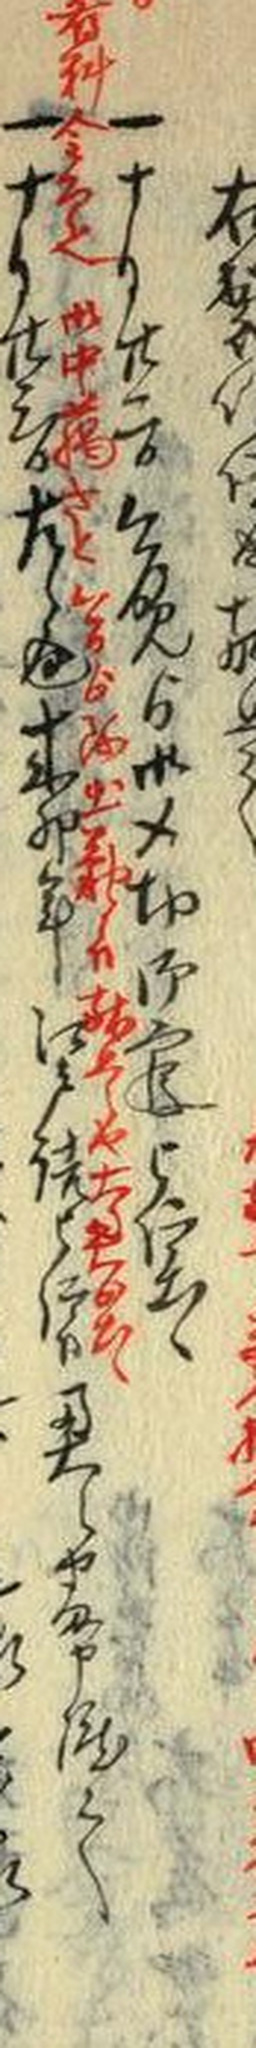一十月廿三日左之通来卯年江戸詰被仰付奥之番申渡之
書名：少傅日録抄（斉承付側向頭取日記、在国）
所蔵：福井県文書館 Fukui Prefectural Archives
